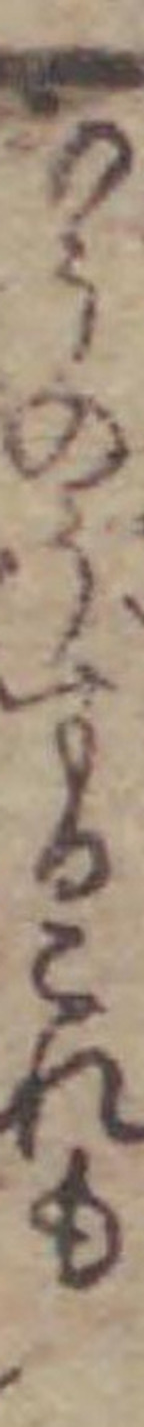ほうのうするこれも
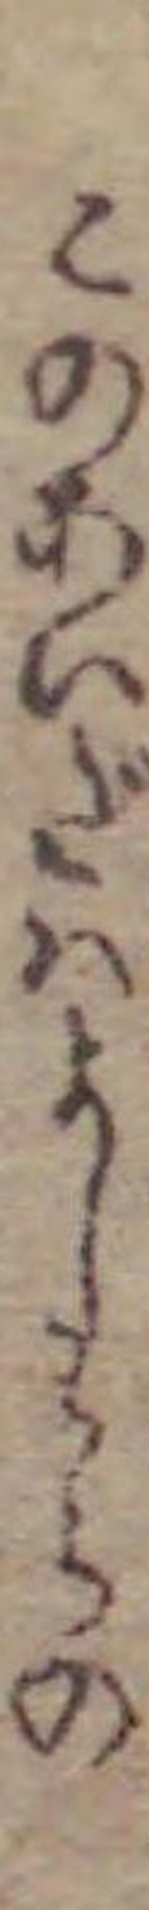このあいだはよしわらの
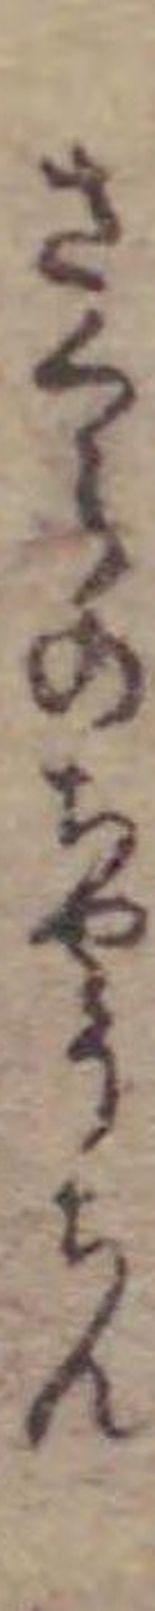さくらのちやうちん
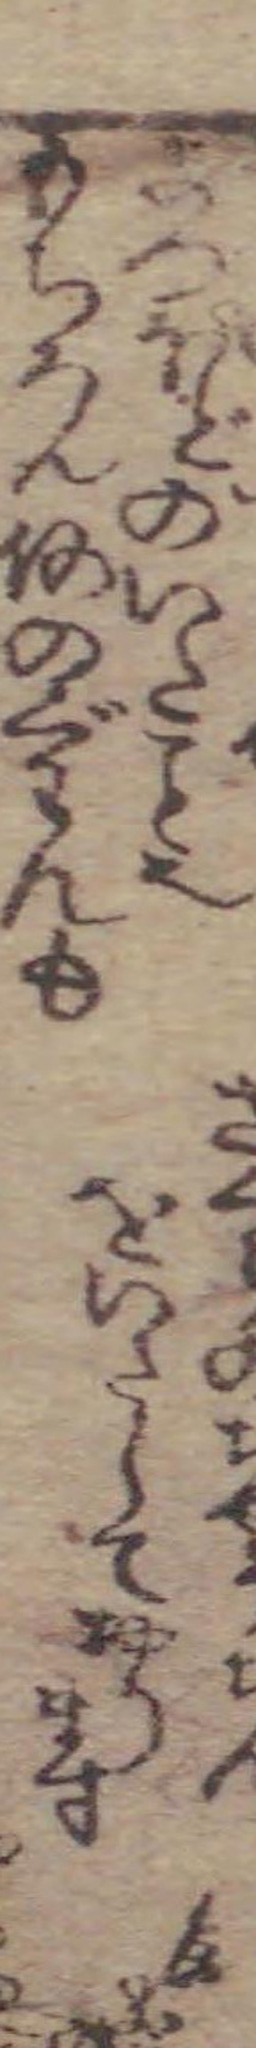もちろん何のぐわんも
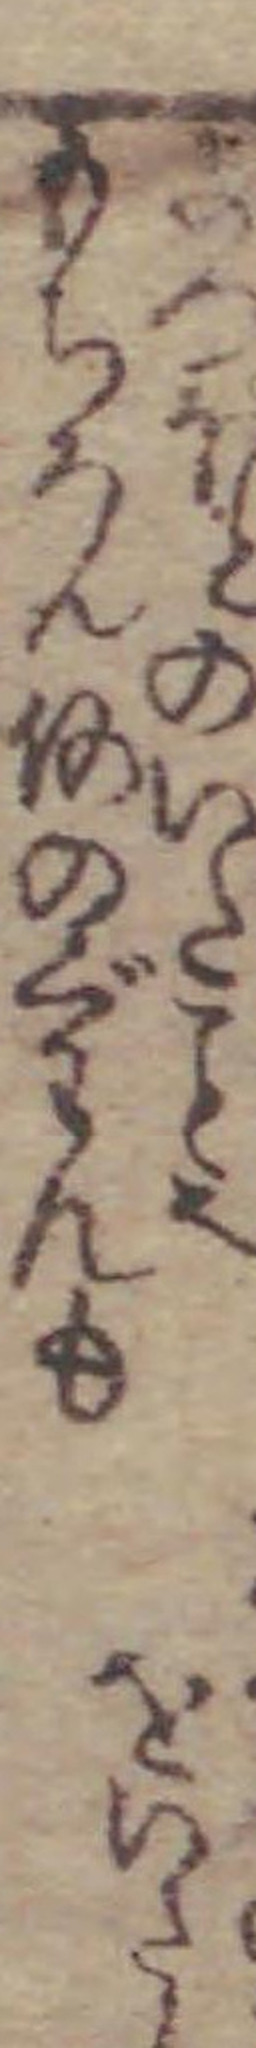もちろん何のぐわんも
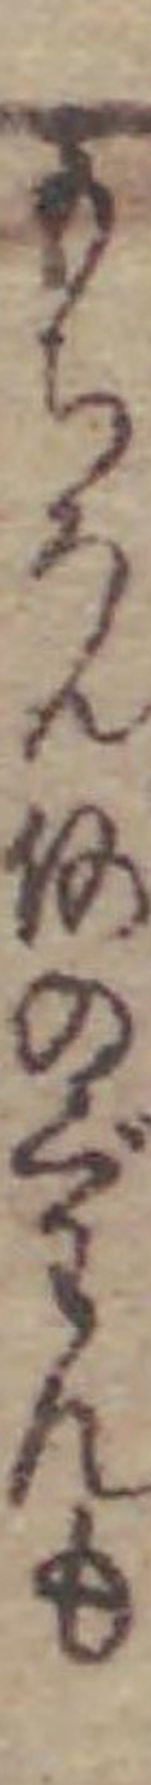もちろん何のぐわんも
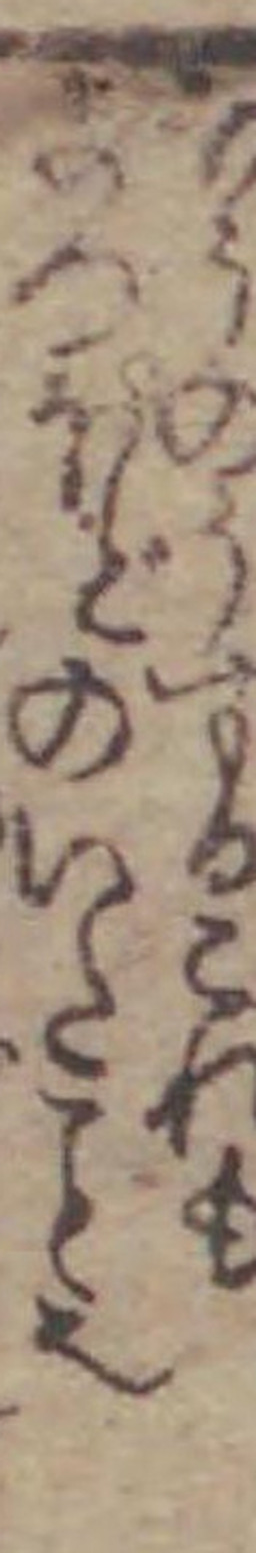よつほどのいたこと也
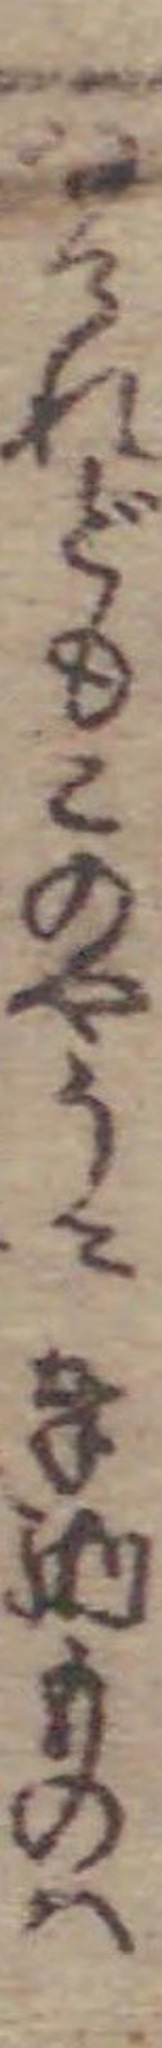なけれどもこのやうに奉納ものは
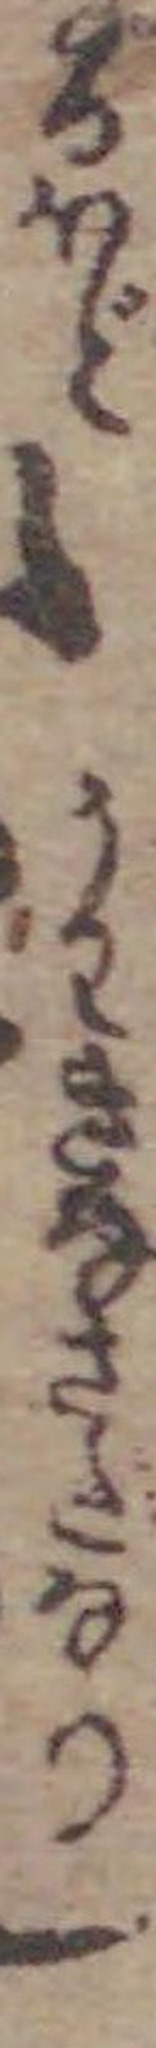なるほどうわきなさたなり

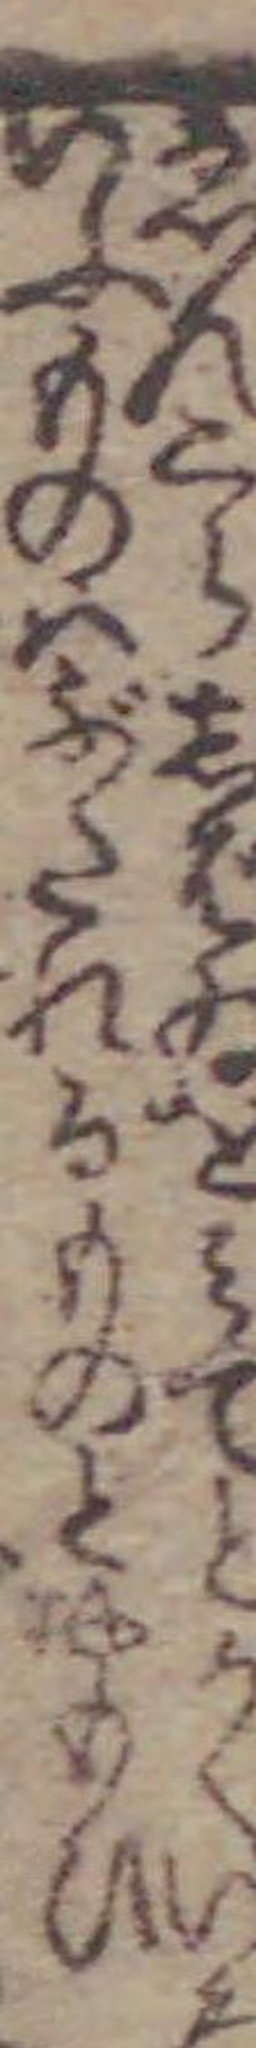いふものはぶたれるものとおもひ
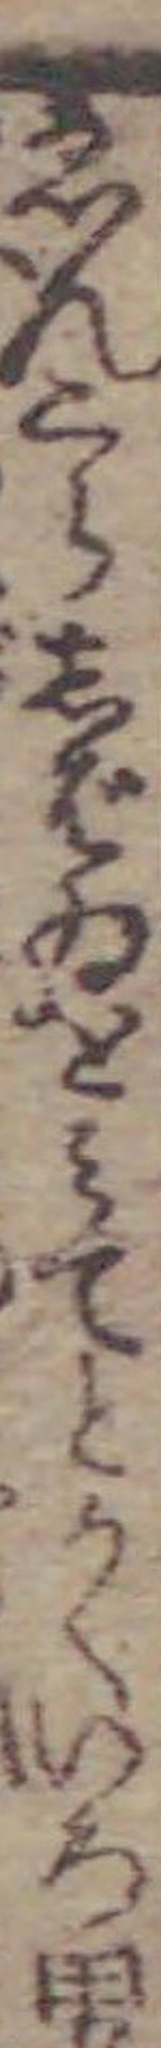ゑん二郎しばゐをみてとかくいろ男と
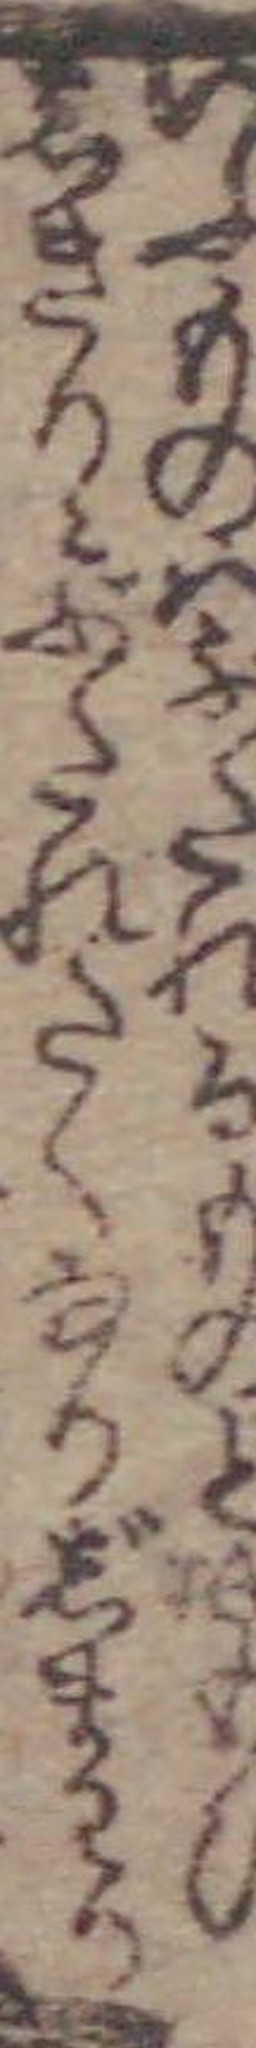しきりとぶたれたくなりじまわり
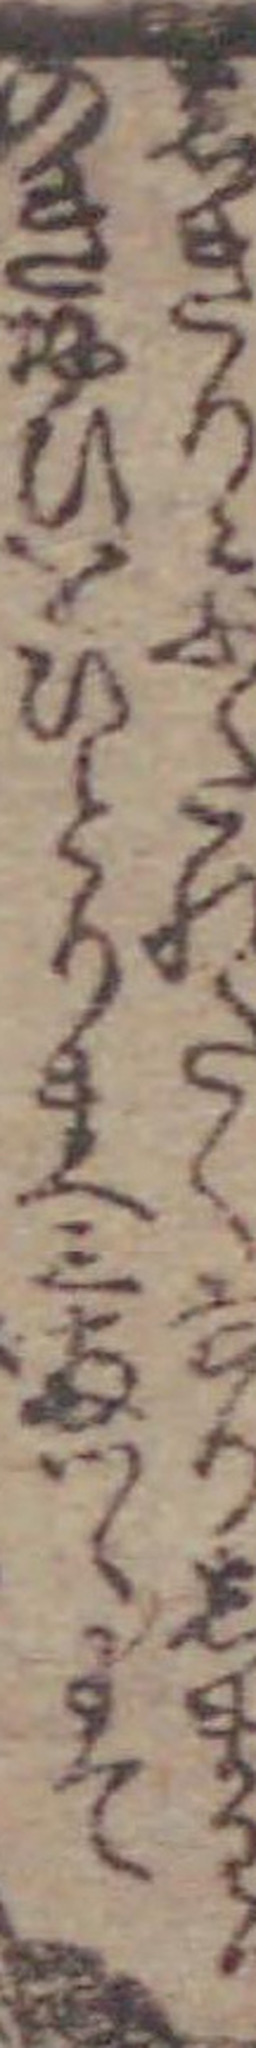のきおひをひとりまへ三両つゝにて
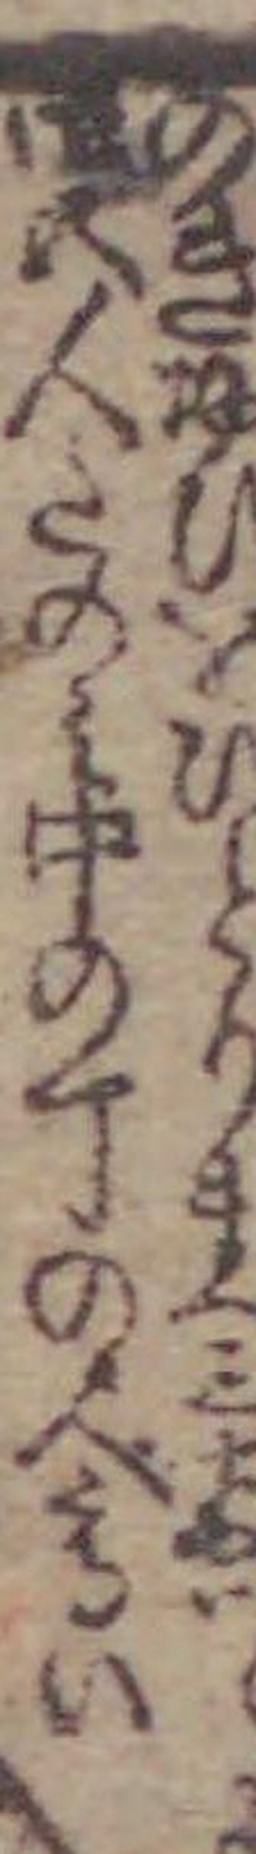四五人たのみ中の丁の人高い
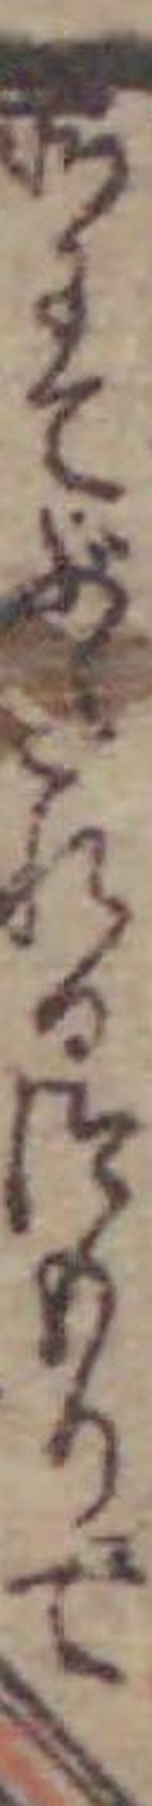所にてぶたれるつもりで
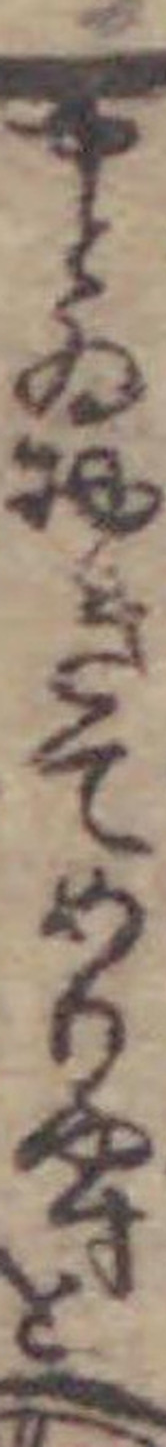やとゐおきてめりやすを
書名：江戸生艶気樺焼 : 3巻
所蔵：国立国会図書館 National Diet Library, JAPAN
